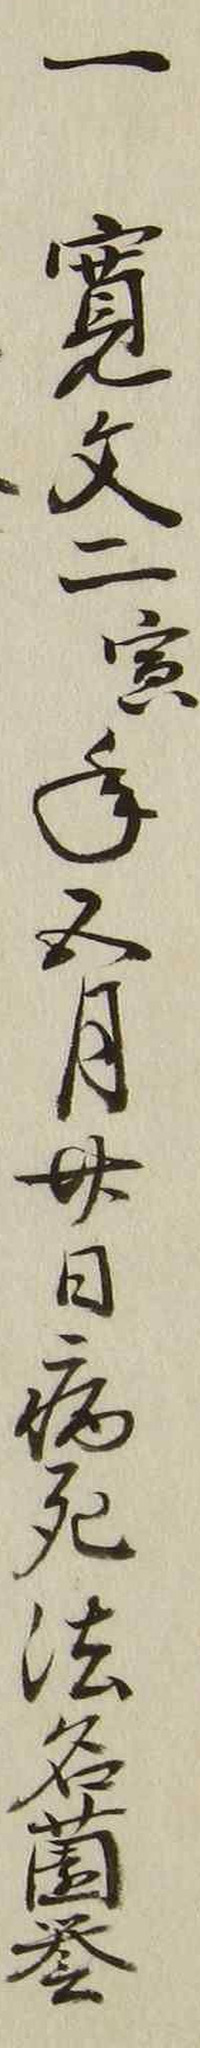一寛文二寅年五月廿日病死法名園誉
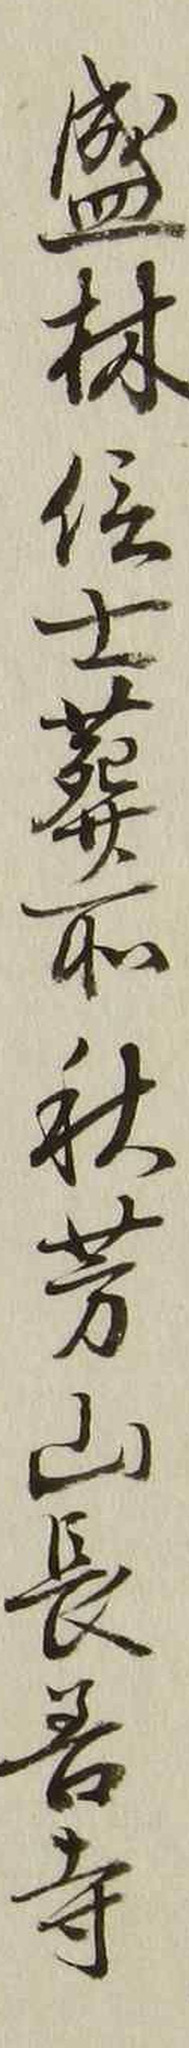盛林信士葬所秋芳山長善寺
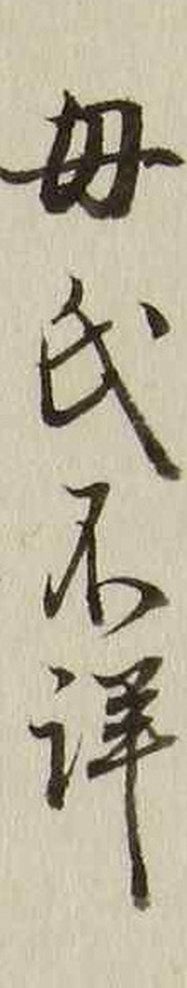母氏不詳
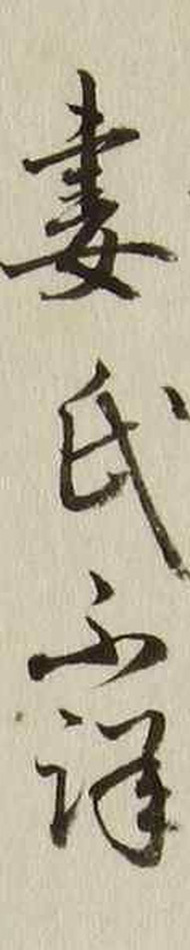妻氏不詳
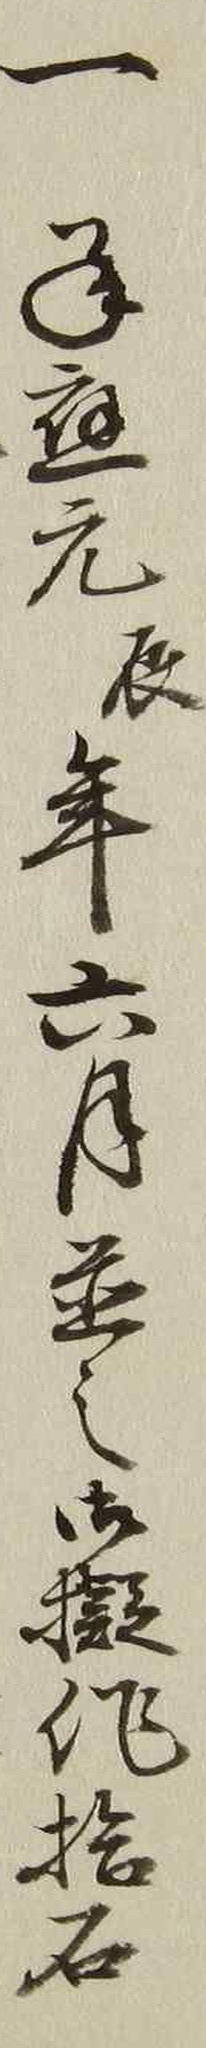一承応元辰年六月並之御擬作拾石
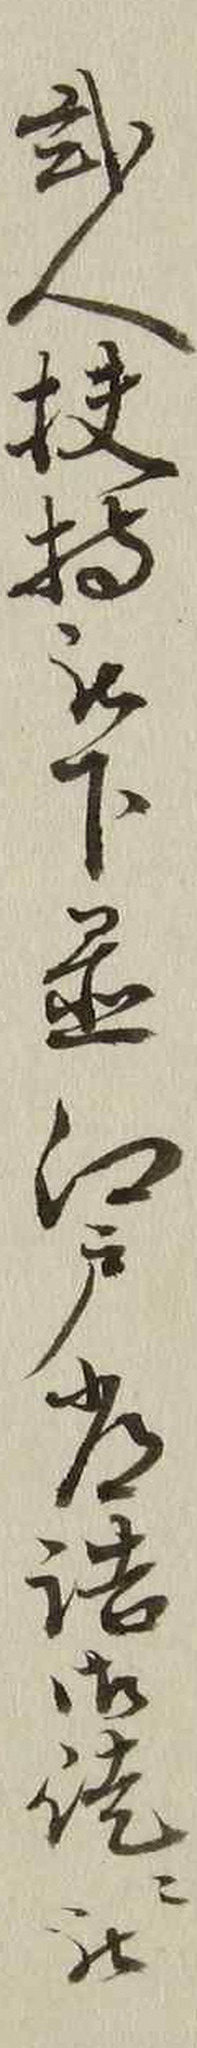弐人扶持被下置江戸常詰御徒ニ被
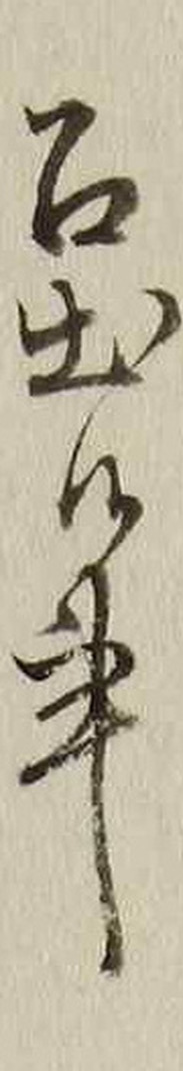召出候事
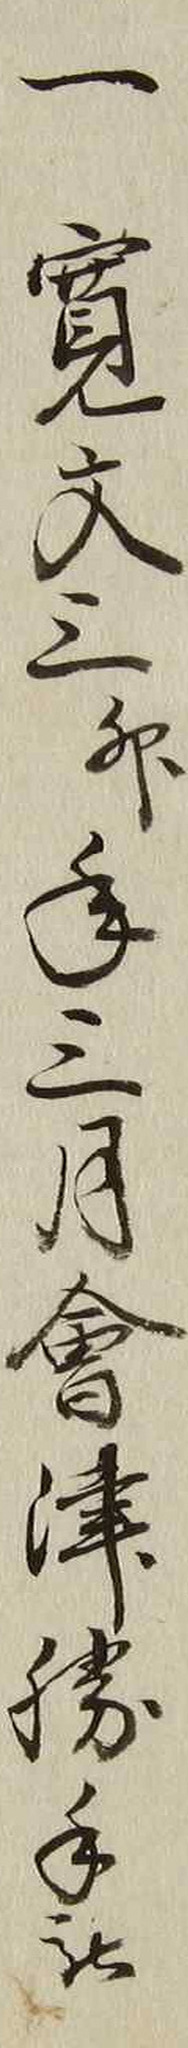一寛文三卯年三月会津勝手被
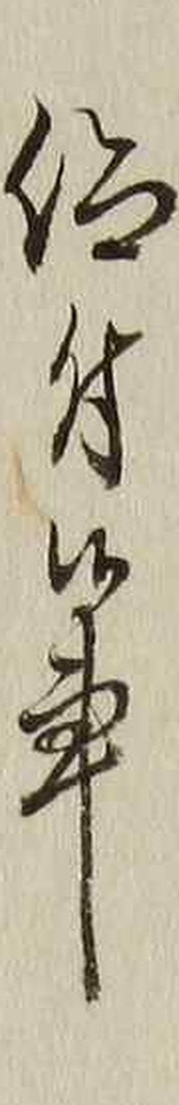仰付候事
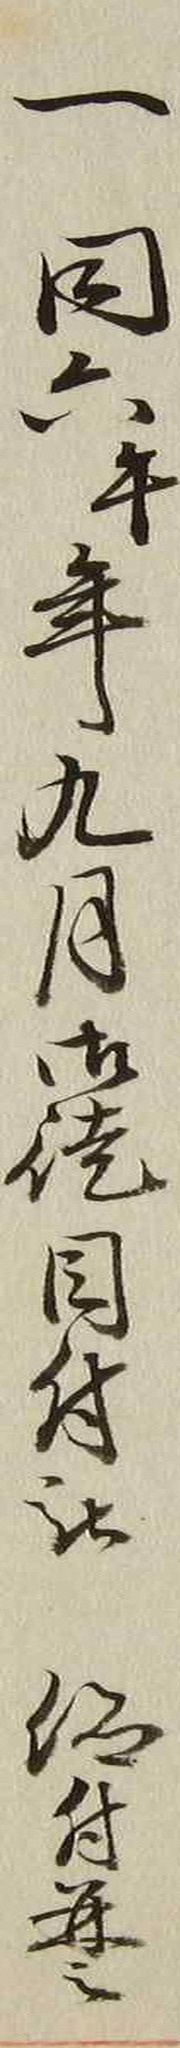一同六午年九月御徒目付被仰付并之
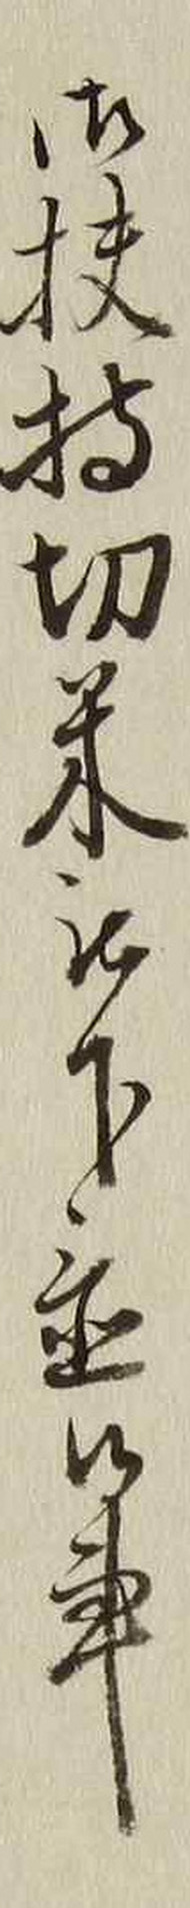御扶持切米被下置候事
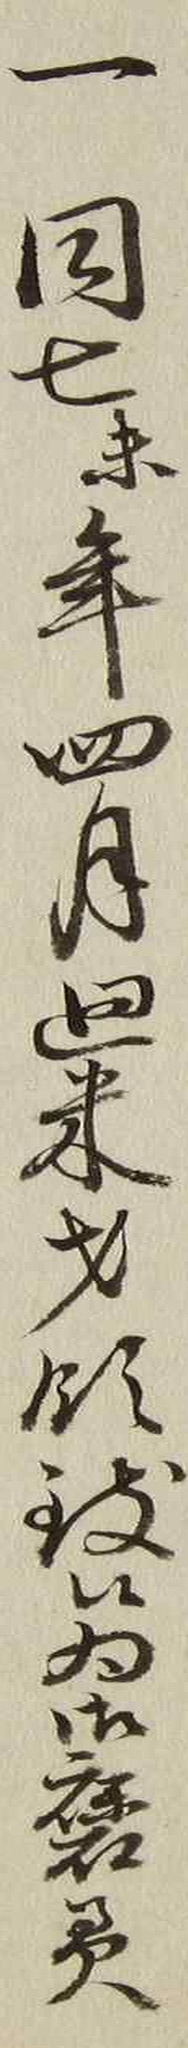一同七未年四月廻米才領致候為御褒美
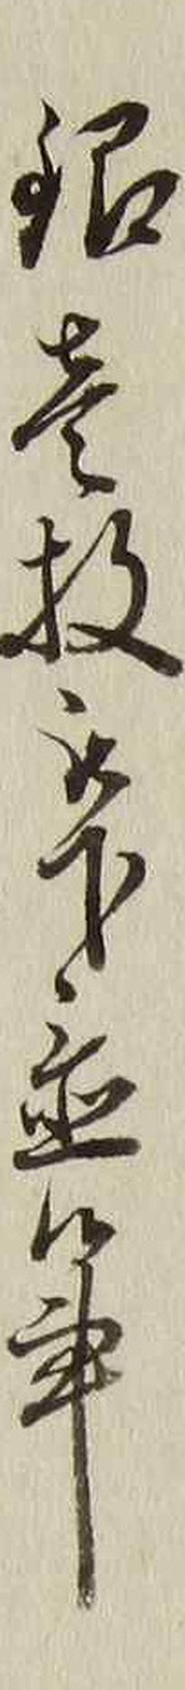銀壱枚被下置候事
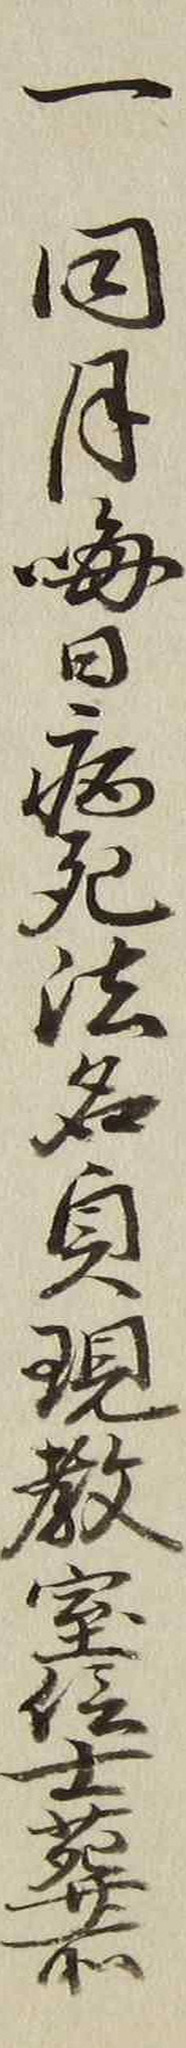一同月晦日病死法名貞現教室信士葬所
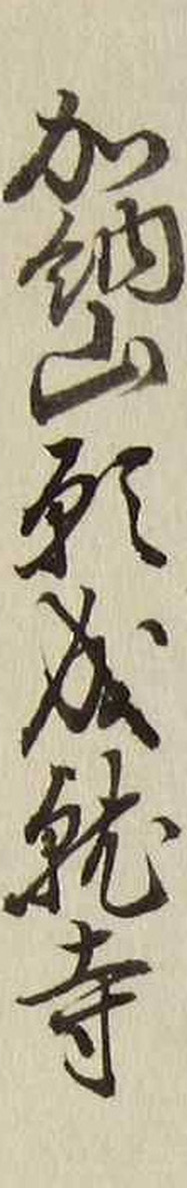加納山願成就寺
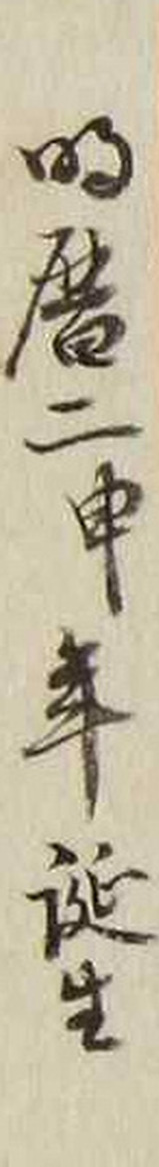明暦二申年誕生
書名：諸士系譜　巻之27　い之部27
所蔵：会津若松市立会津図書館
